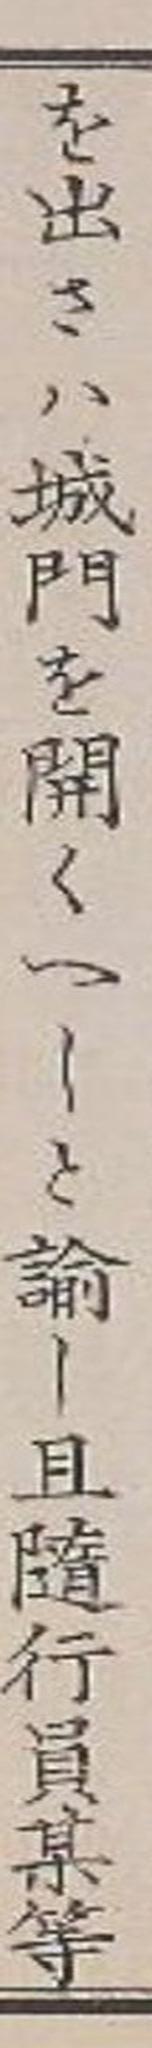を出さは城門を開くへしと諭し且随行員某等
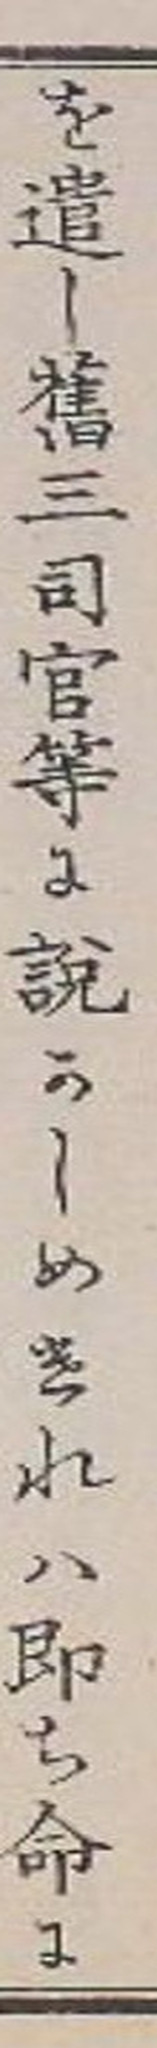を遣し旧三司官等に説かしめけれは即ち命に
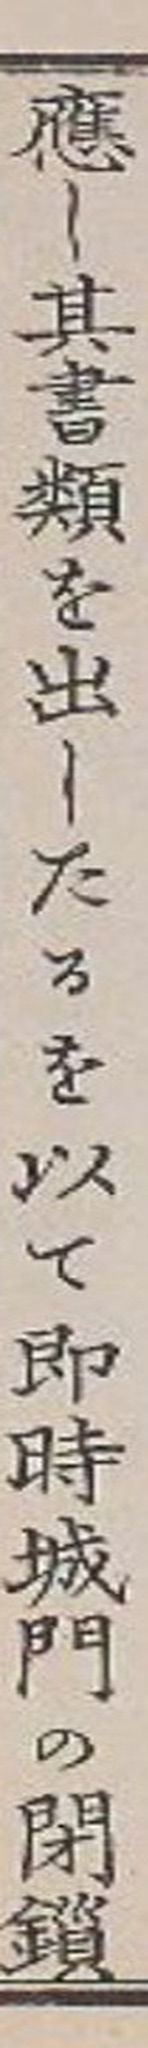応し其書類を出したるを以て即時城門の閉鎖
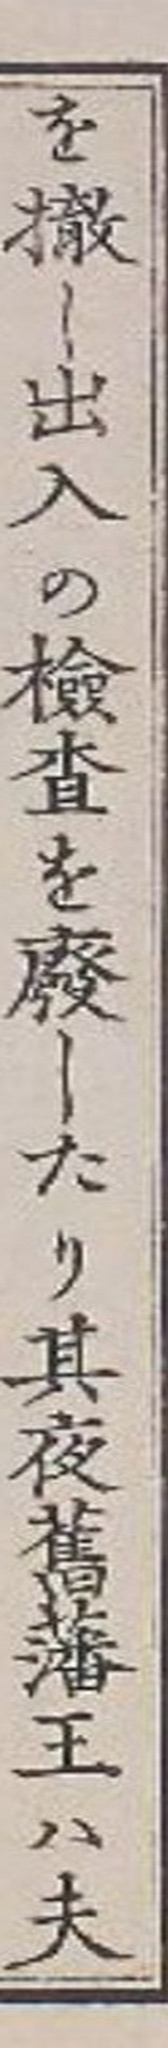を撤し出入の検査を廃したり其夜旧藩王は夫
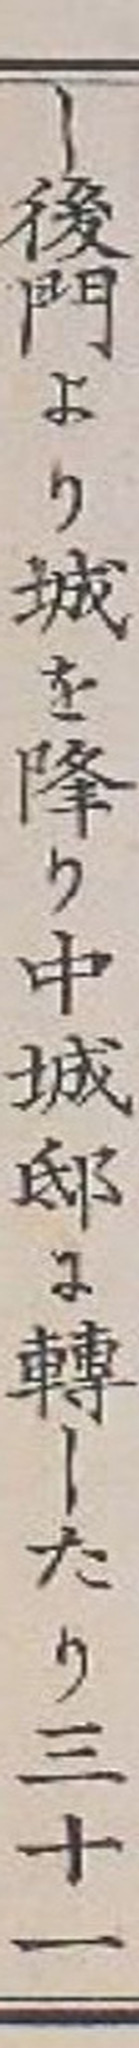し後門より城を降り中城邸に転したり三十一
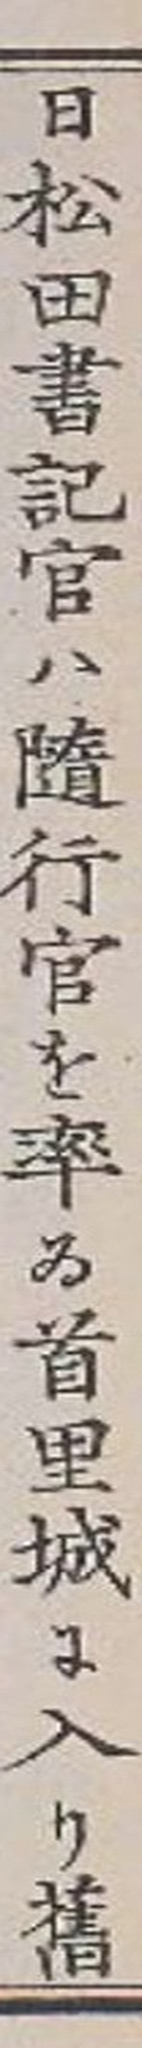日松田書記官は随行員を率ゐ首里城に入り旧
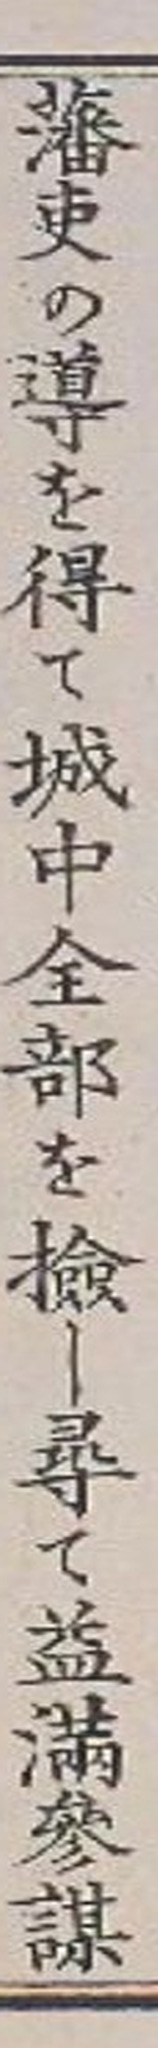藩吏の導を得て城中全部を検し尋て益満参謀
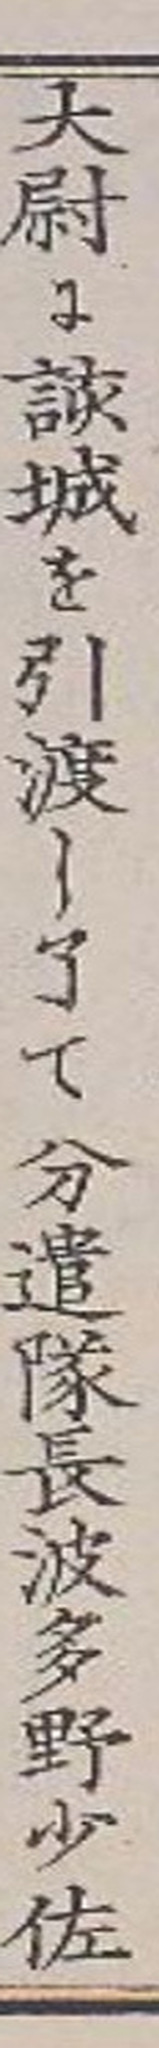大尉に該城を引渡し了て分遣隊長波多野少佐
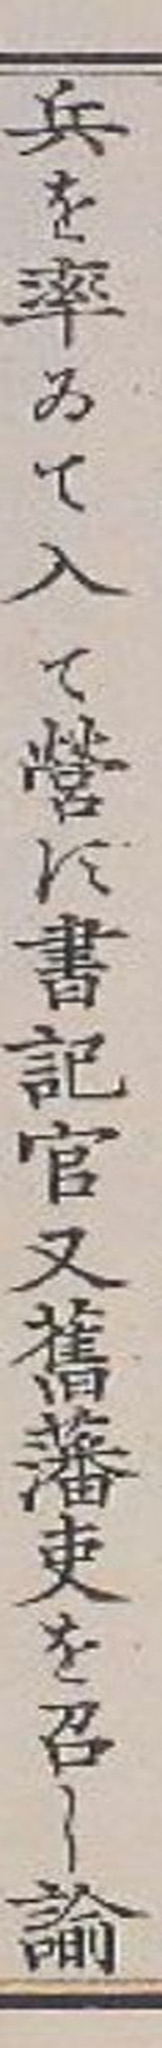兵を率ゐて入て営す書記官又旧藩吏を召し諭
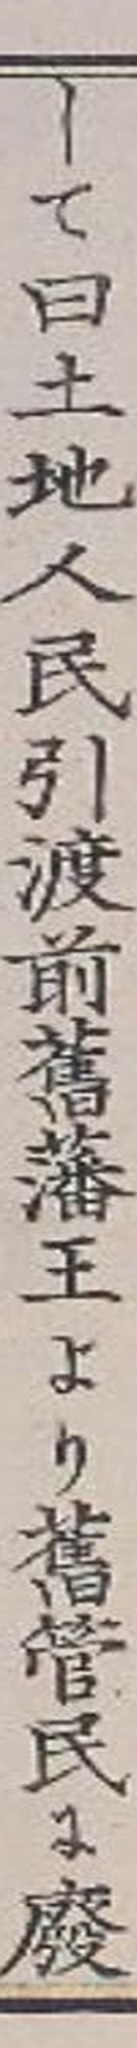して曰土地人民引渡前旧藩王より旧管民に廃
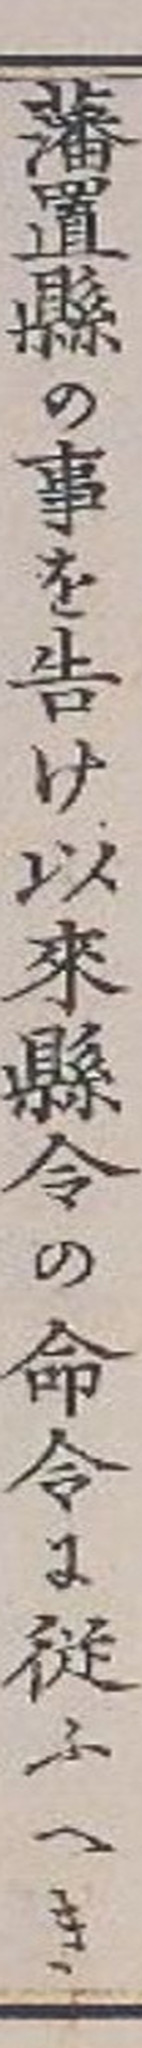藩置県の事を告け以来県令の命令に従ふへき
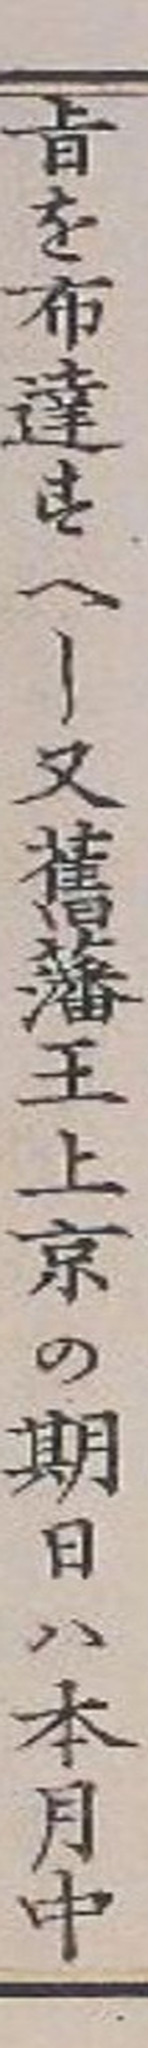旨を布達すへし又旧藩王上京の期日は本月中

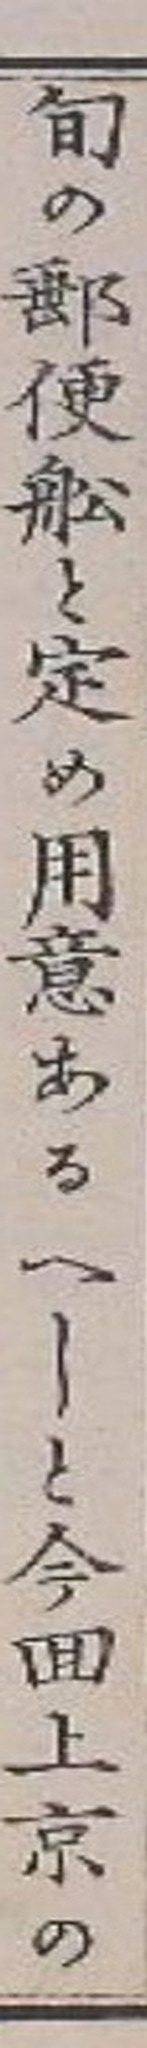旬の郵便船と定め用意あるへしと今回上京の
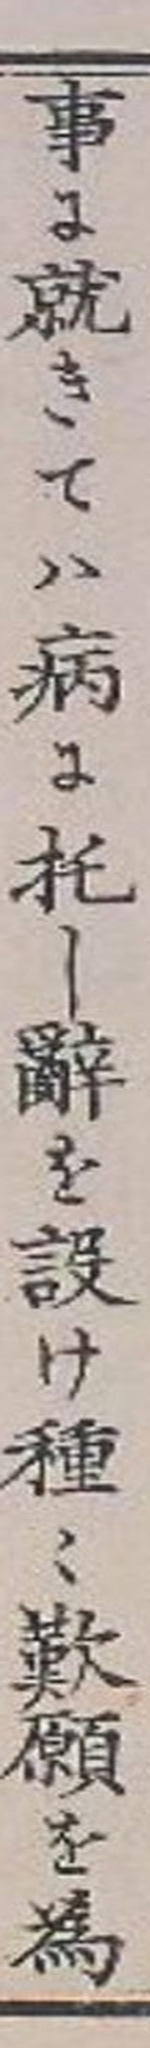事に就きては病に托し辞を設け種々歎願を為
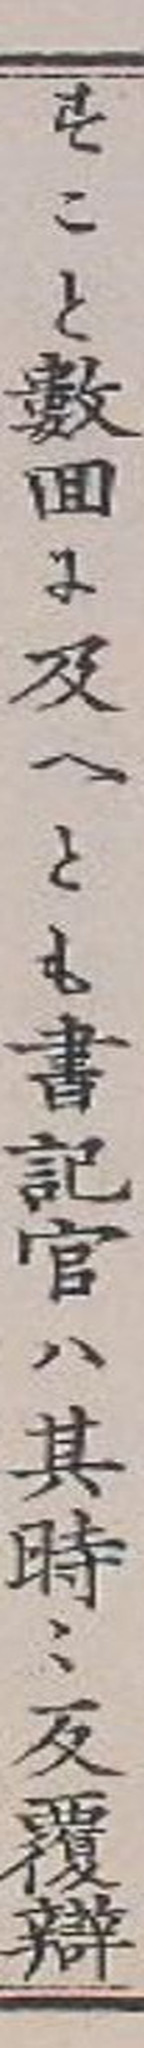すこと数回に及へとも書記官は其時々反覆弁
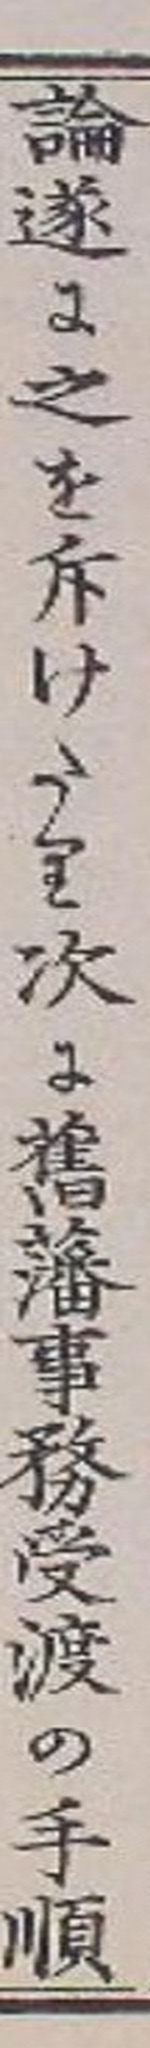論遂に之を斥けたり次に旧藩事務受渡の手順
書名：南島紀事 下
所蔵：University of the Ryukyus Library
